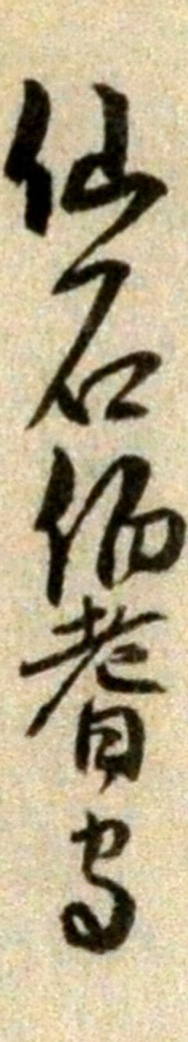仙石伯耆守
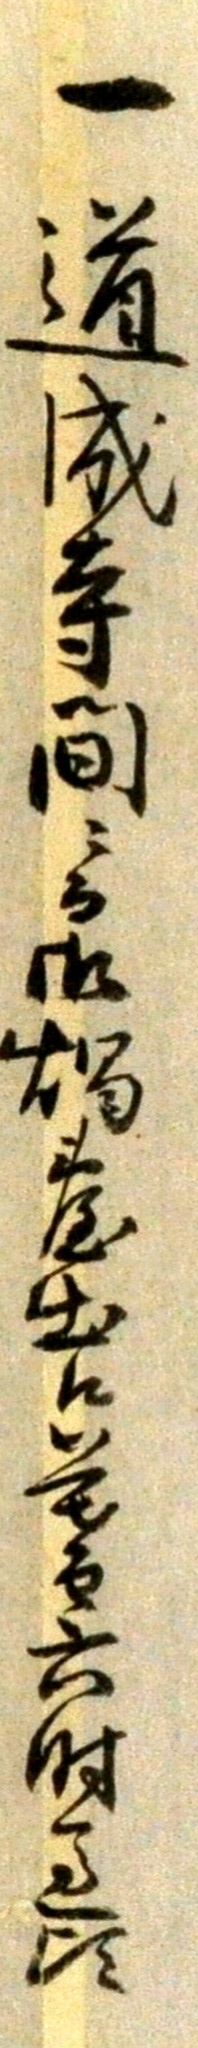一道成寺間ニ而御燭臺出候暮六時過頃
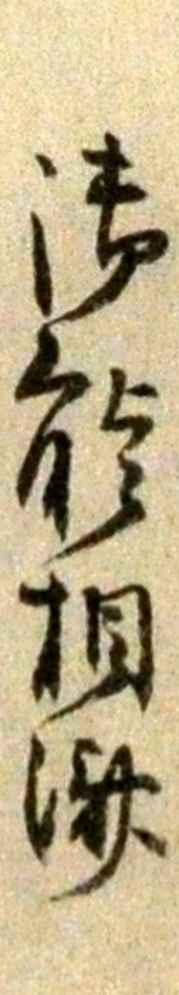御能相済
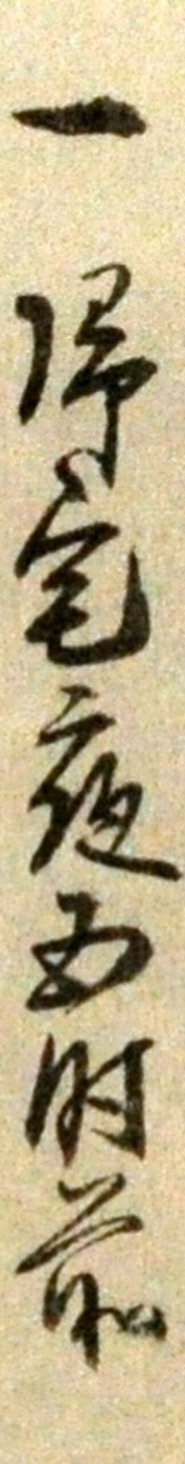一帰宅夜五時前
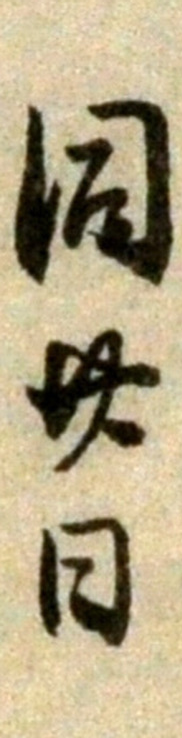同廿日
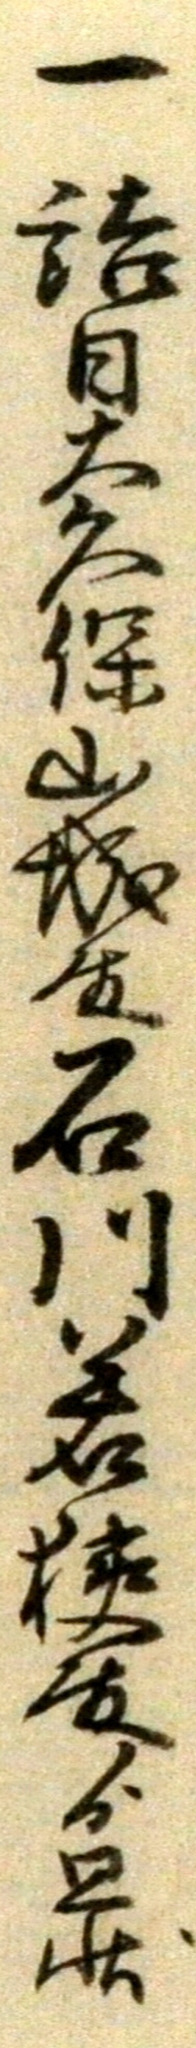一詰日大久保山城殿石川若狭殿ゟ廻状

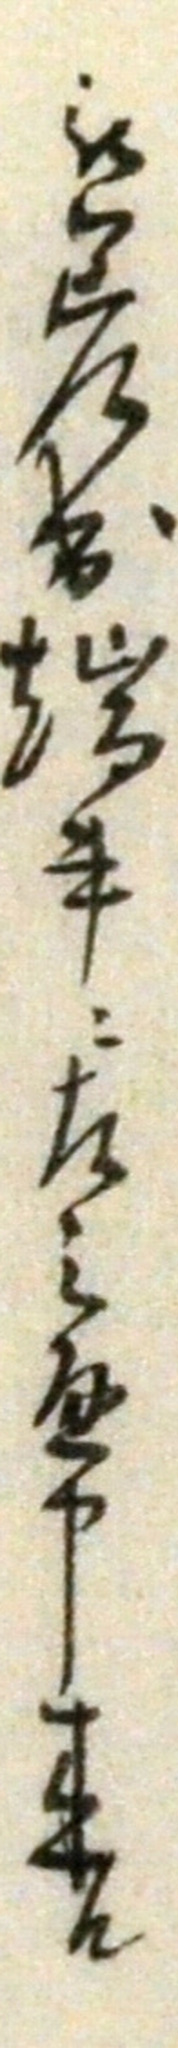被差出端書ニ左之通申来ル
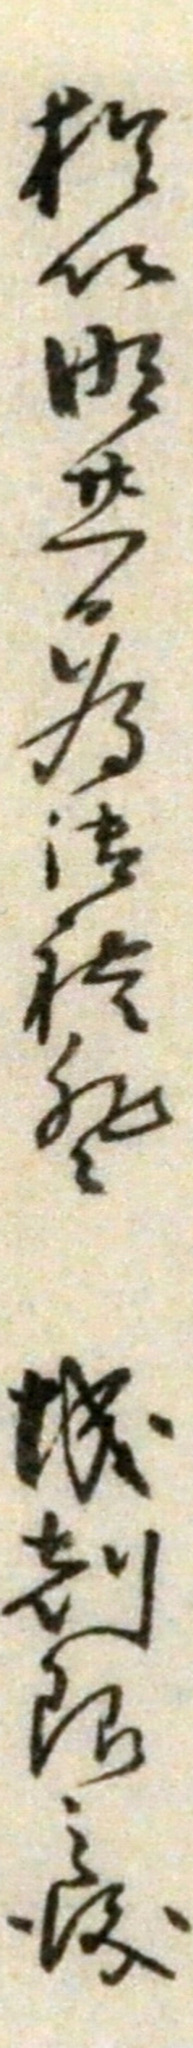猶以明廿一日為御禮登城刻限之儀
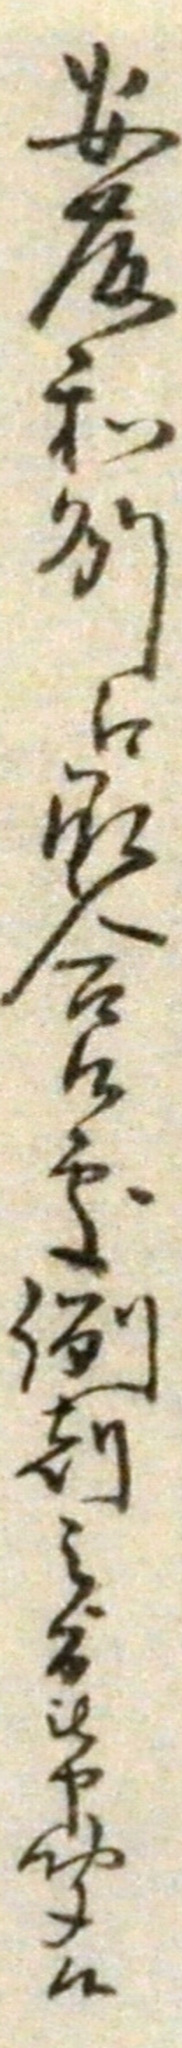安藤和州え承合候處例刻之旨被申聞候
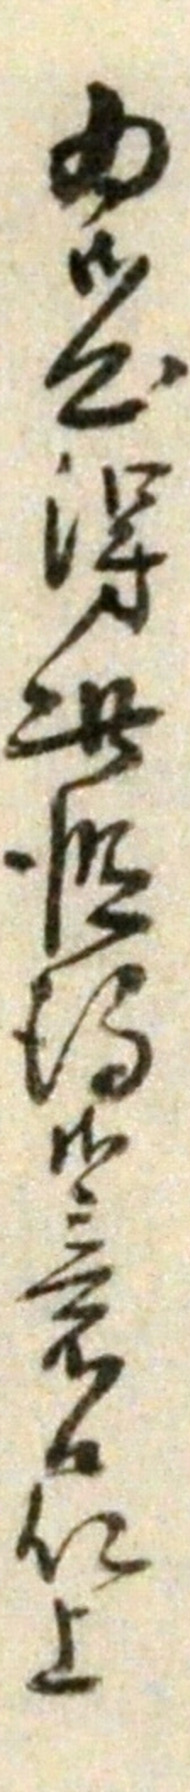為御心得此段得御意候以上
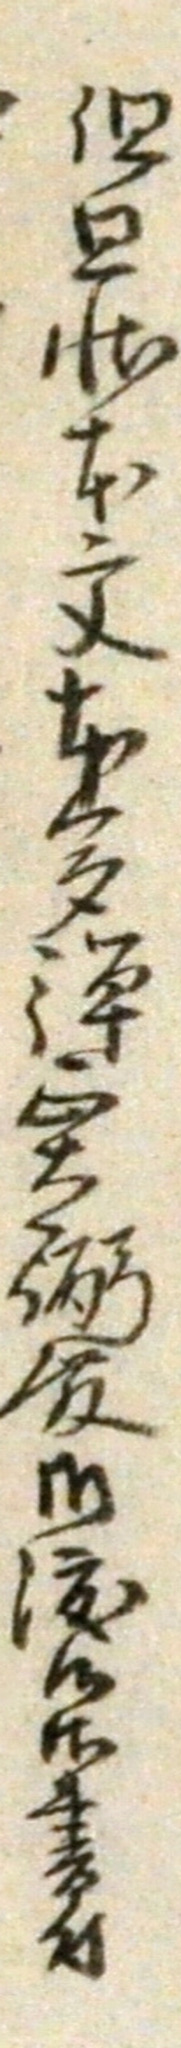但廻状本文本多弾正大弼殿御渡候御書付
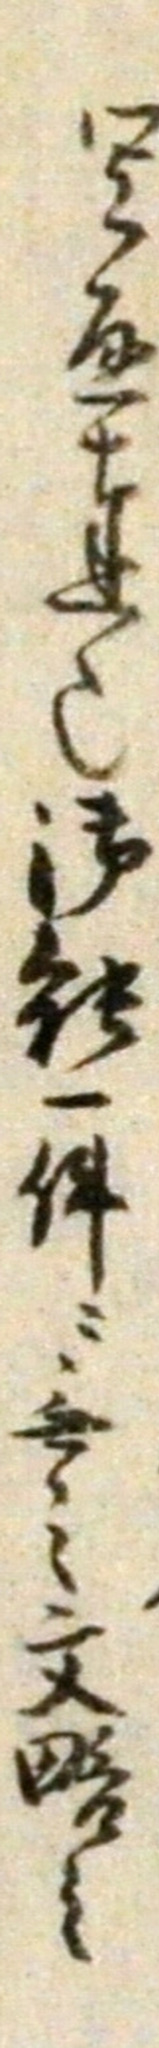写通達也御能一件ニ無之文略之
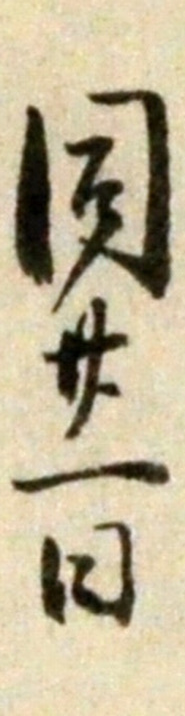同廿一日
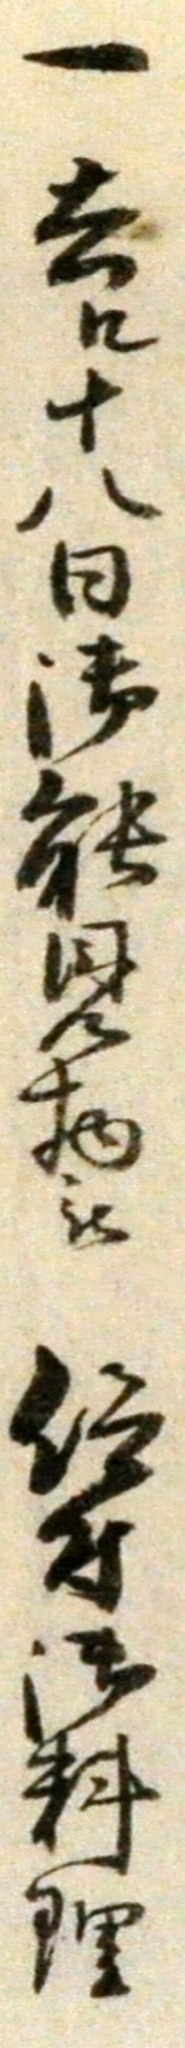一去ル十八日御能見物被仰付御料理
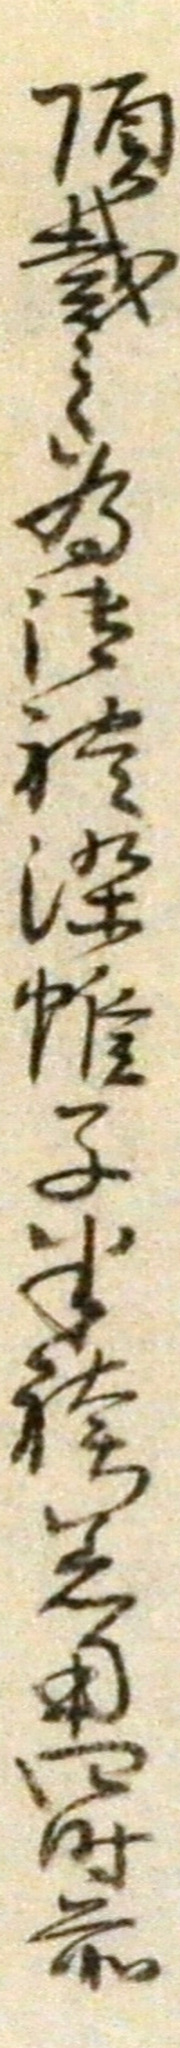頂戴之為御禮染帷子半袴着用四時前
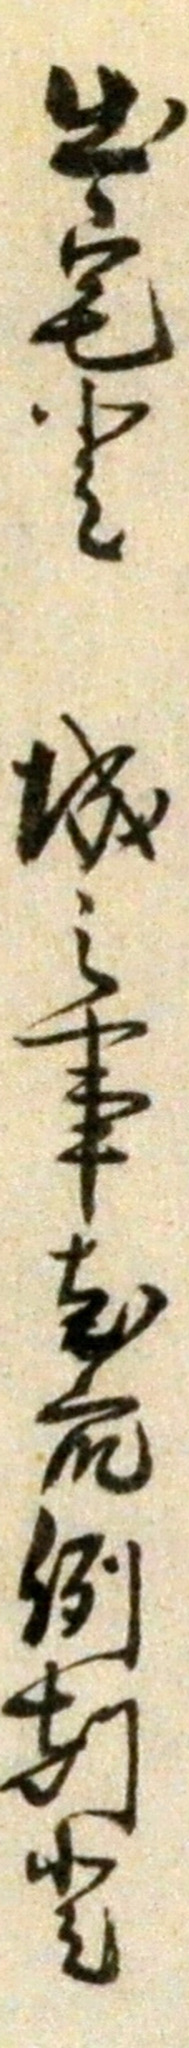出宅登城之事老衆例刻登
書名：若君様（家斉嫡男）誕生諸祝儀ノ節ノ留書外
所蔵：伊那市立高遠町図書館・合同会社AMANE
